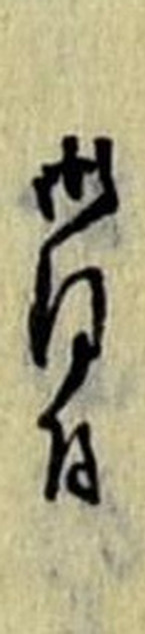御目付
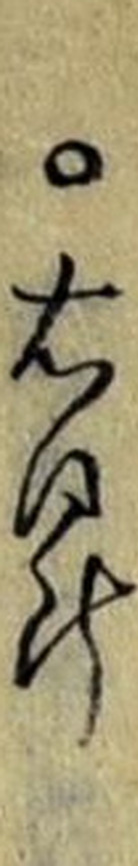○右同断
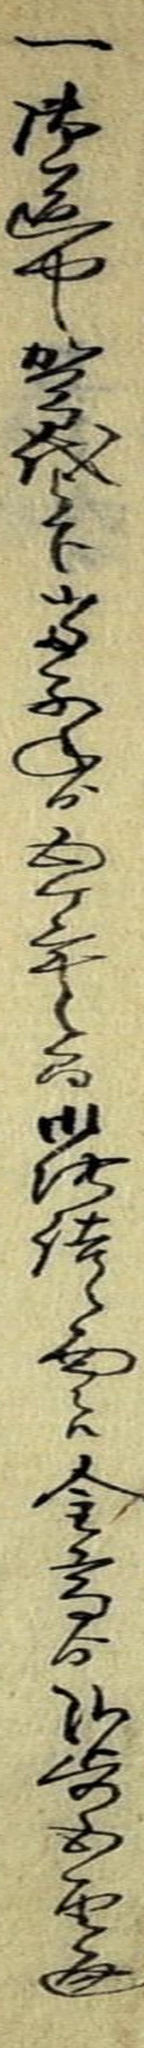一御道中駕代被下当子年ゟ五ヶ年之間御供詰之面々は金高ゟ弐歩五厘通
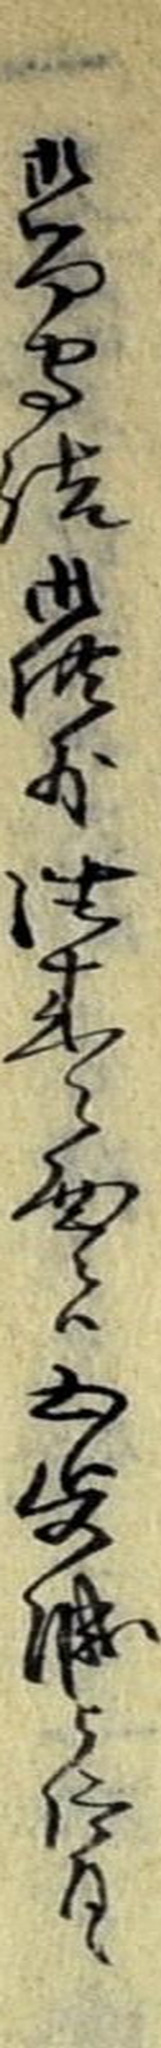御留守詰御供外往来之面々は五歩減被仰付候
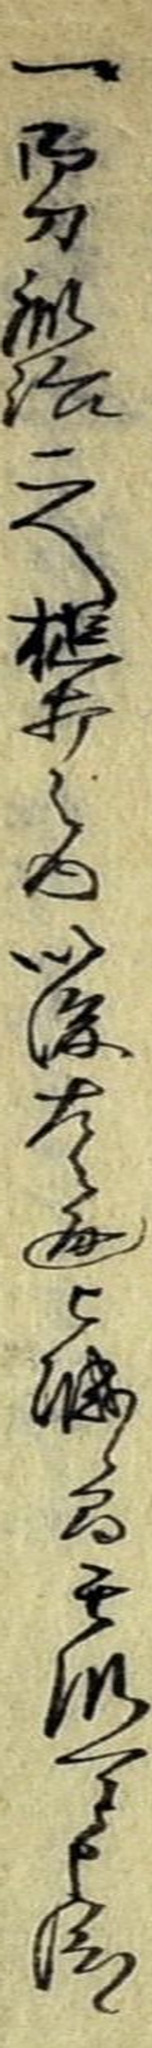一御刀鍛治二人框打之内以後左之通被減候間其段可被申渡候
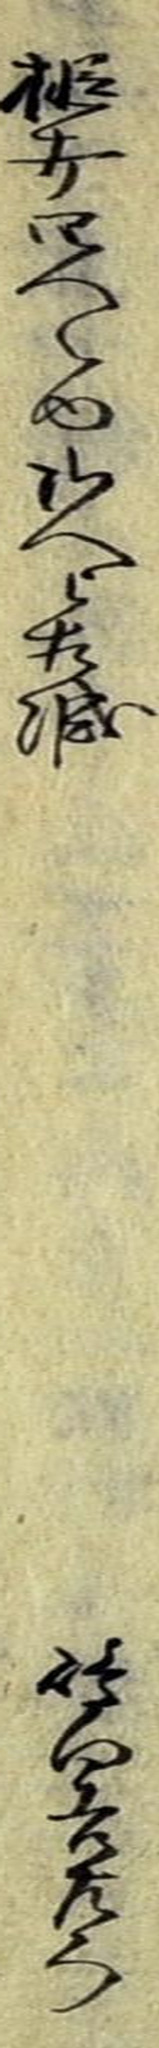框打四人之内弐人被相減嶋田吉左衛門
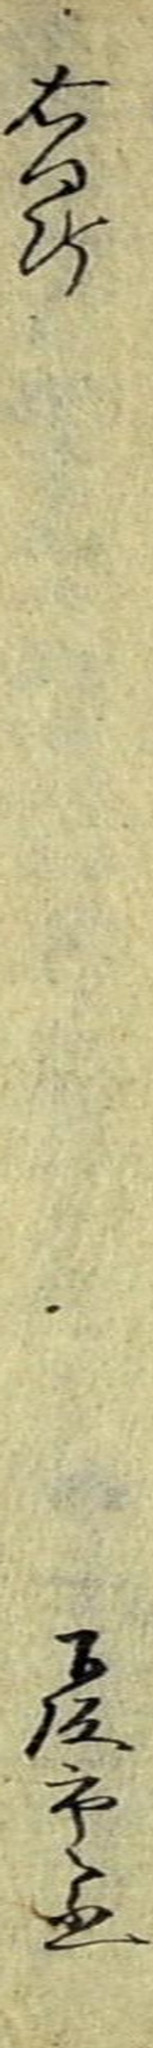右同断下坂市之丞
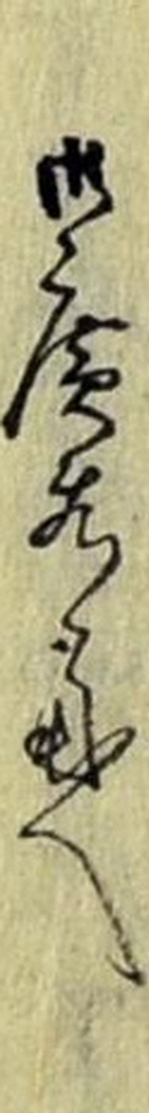御広敷御用人
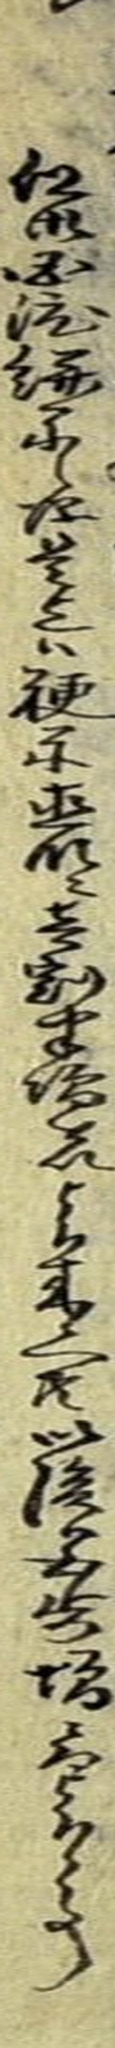但御国渡餅米之儀是迄は粳米直段に壱割半増を以被下来候へ共以後は五歩増に而被下之候事
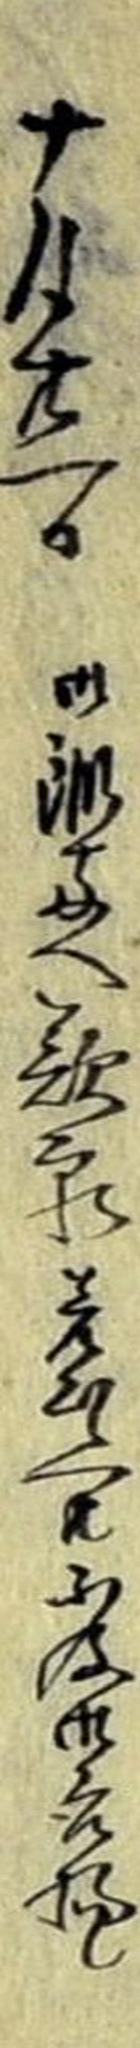十月廿一日御鍛両人歎願差出候へ共不及御取揚候
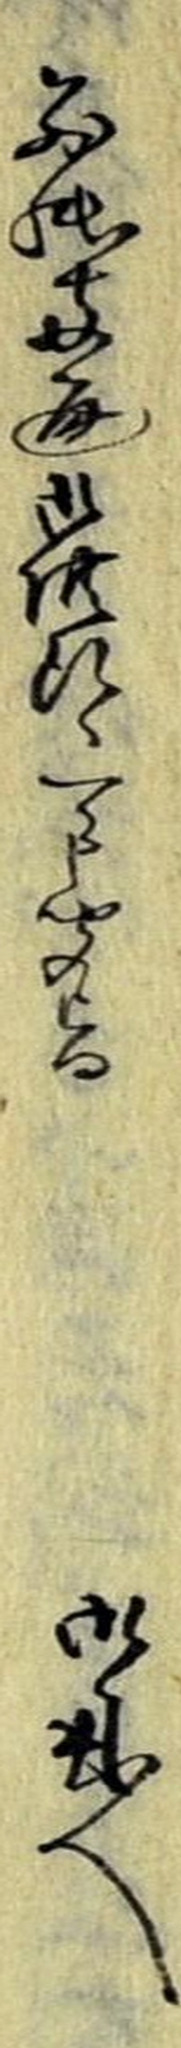別紙両通御供頭へ可申聞候旨御用人
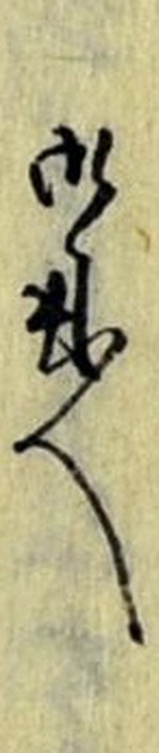御用人

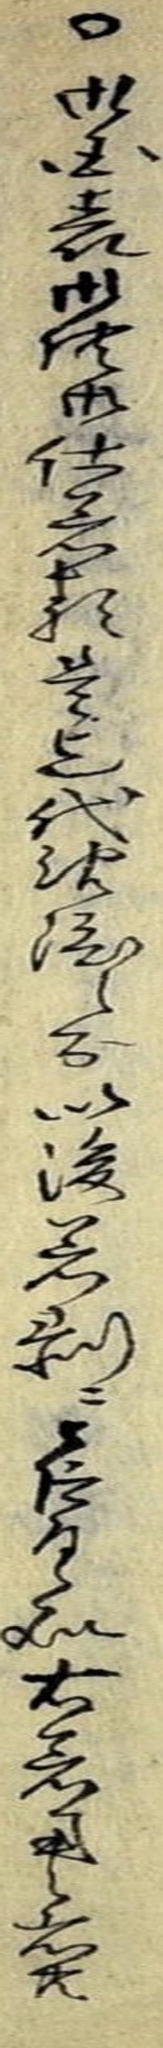○御国表御供御仕着類是迄代銀渡之分以後着剥に被仰付候処右着用之者共
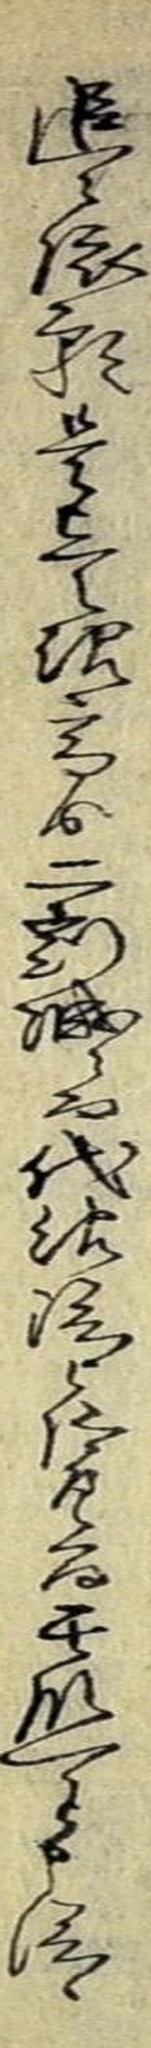追々依願是迄之銀高ゟ二割減に而代銀渡被仰付候間其段可被申渡候
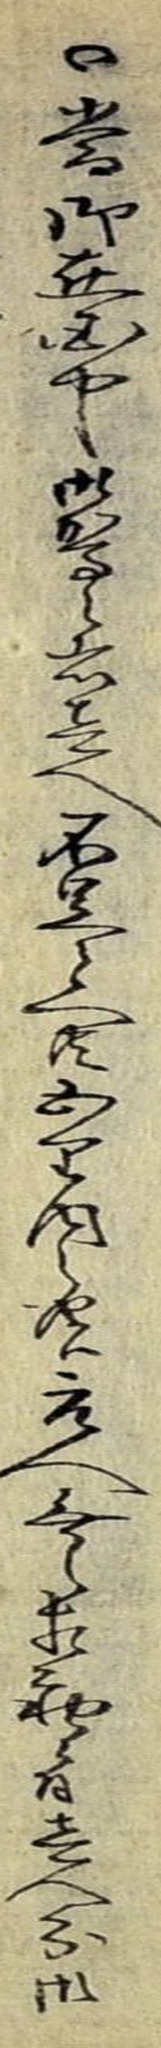○当御在国中御駕之者壱人不足候へ共五里内の儀は取人無之相勤候に付壱人分御
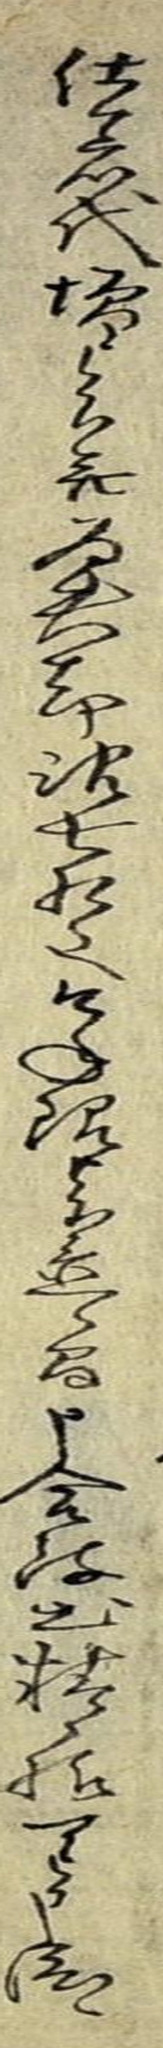仕着代増に被下并為失却銀七拾匁今年限被下置候間申合致出精候様可被申渡候
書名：命令之部 四
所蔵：福井県文書館 Fukui Prefectural Archives
